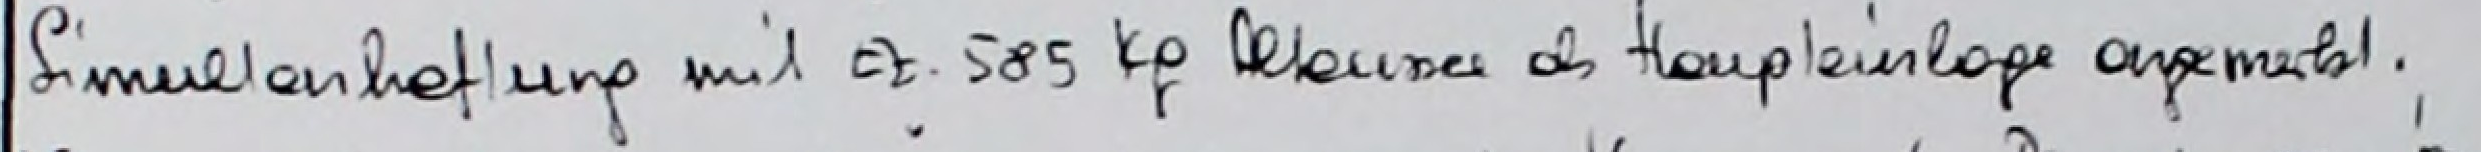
Simultanhaftung mit EZ. 585 kg Altaussee als Haupteinlage angemerkt.
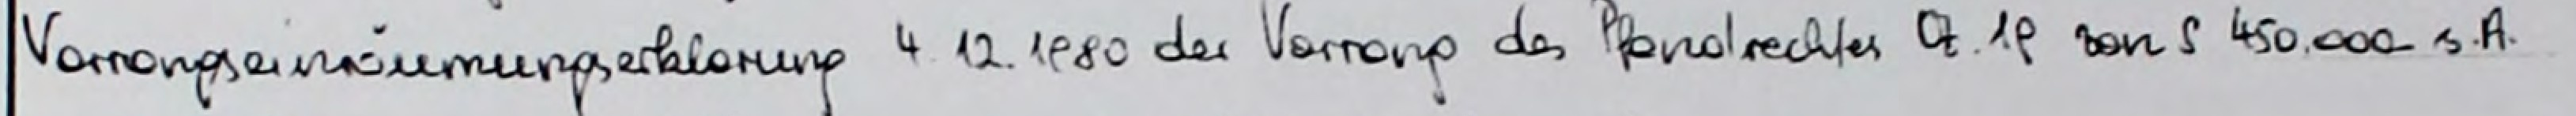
Vorrangseinäumungserklärung 4.12.1980 der Vorrang des Pfandrechtes OZ. 19 von S 450.000- s.A.
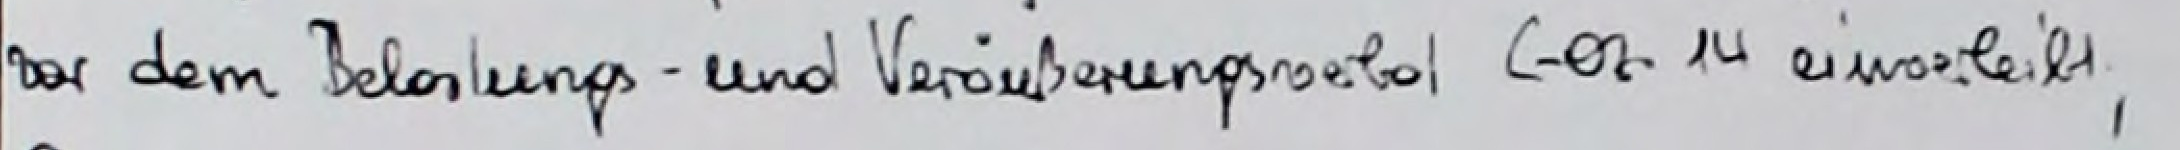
vor dem Belastung - und Veräußerungsverbot C-OZ. 14 einverleibt;
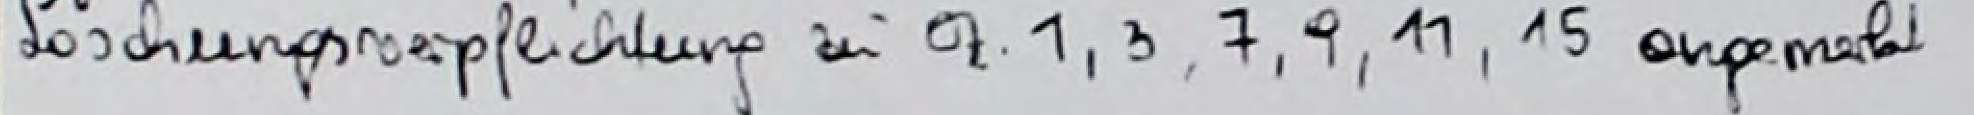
Löschungsverpflichtung zu OZ. 1, 3, 7, 9, 11, 15 angemerkt
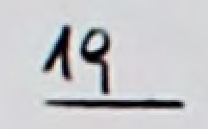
19
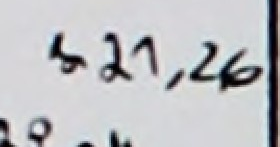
s. 21, 26
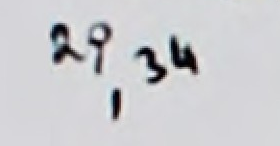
29, 34
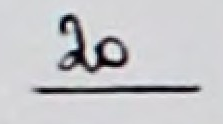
20
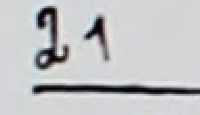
21
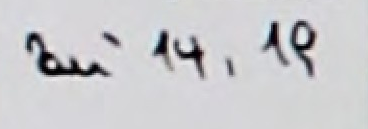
zu 14, 19
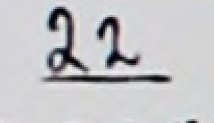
22
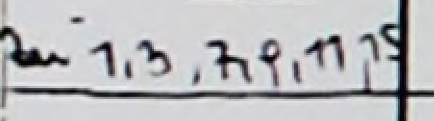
zu 1, 3, 7, 9, 11, 15
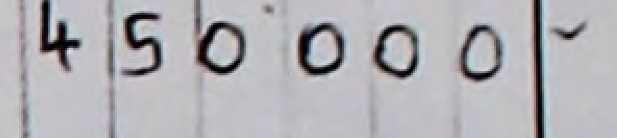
450000
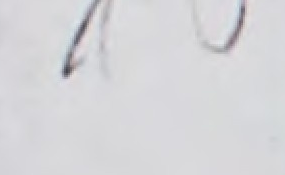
10
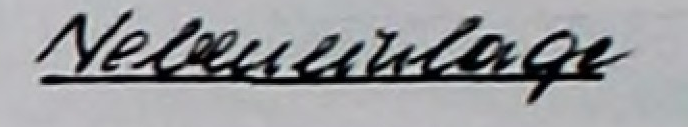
Nebeneinlage
